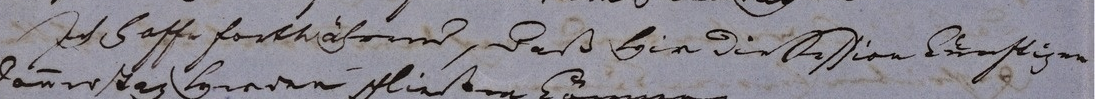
Ich hoffe fortwährend, daß wir die Session künftigen
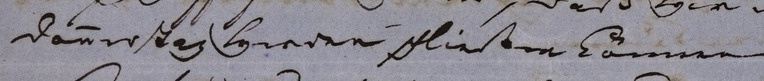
Donnerstag werden schließen können.
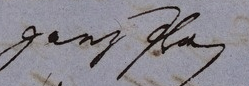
ganz Ihr
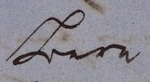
Escher
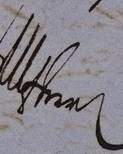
Bern
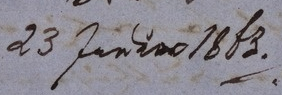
23 Januar 1863.
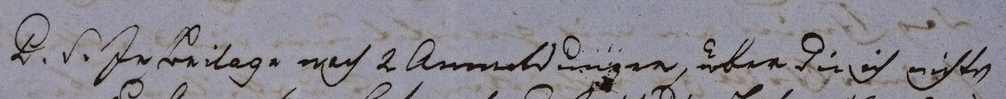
P. S. In Beilage noch 2 Anmeldungen, über die ich nichts
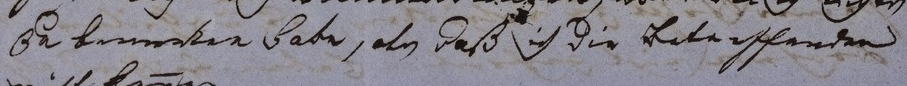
zu bemerken habe, als daß ich die Betreffenden
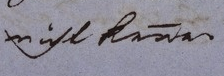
nicht kenne.
